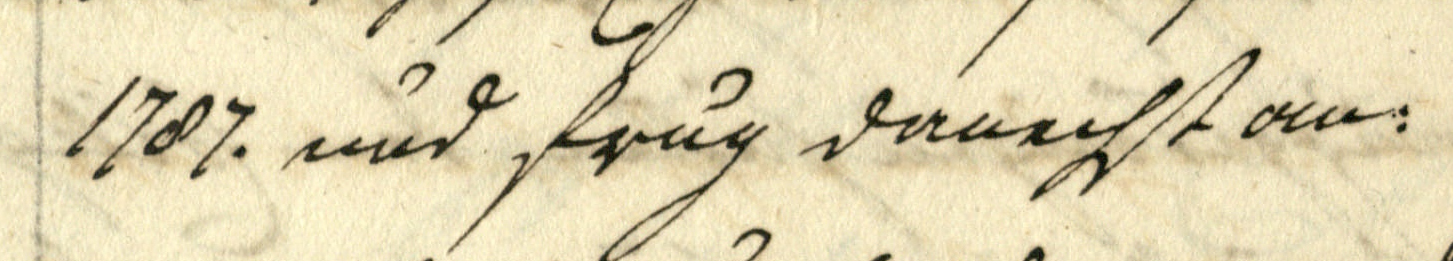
1787. und frug danechst an:
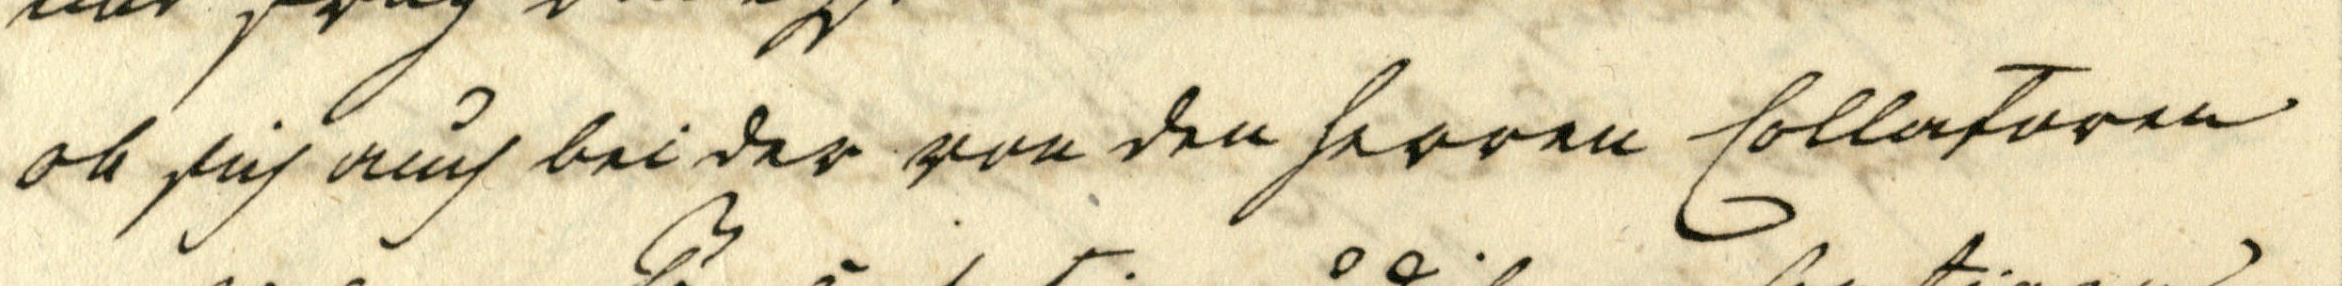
ob sich auch bei der von den Herren Collatoren
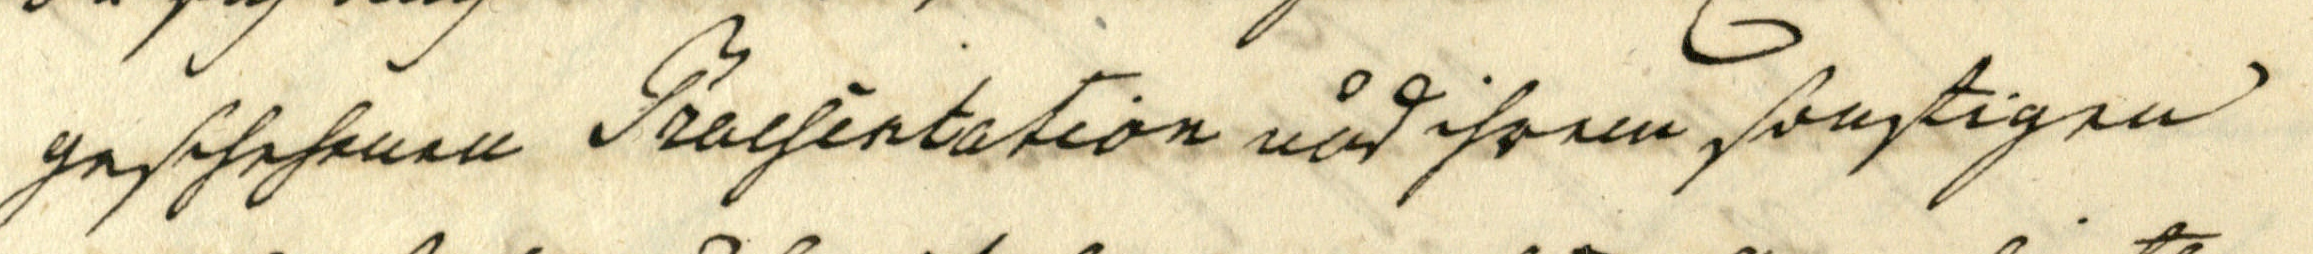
geschehenen Praesentation und ihrem sonstigen
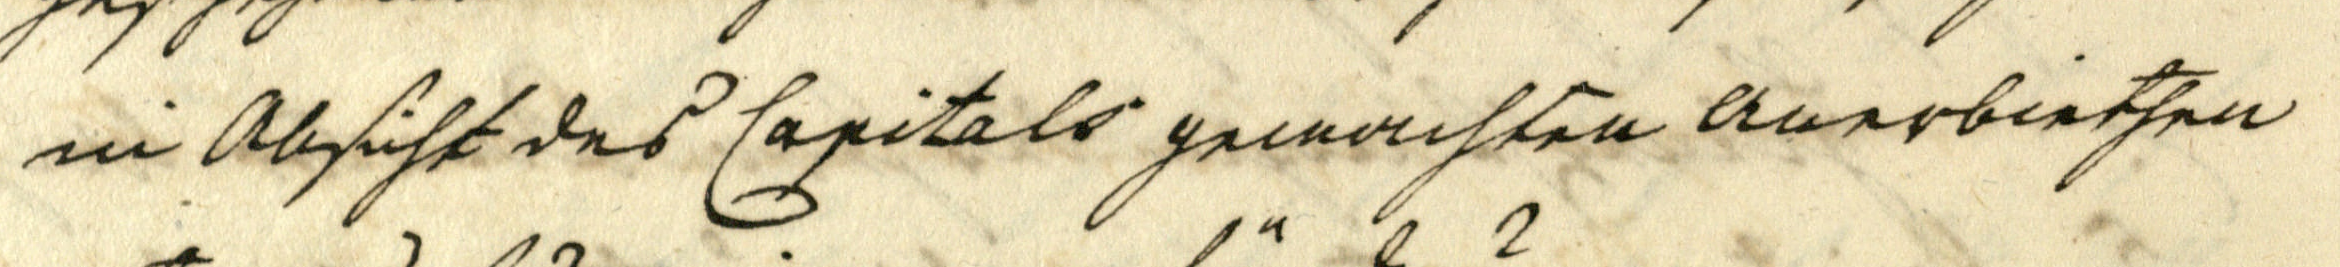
in Absicht des Capitals gemachten Anerbiethen
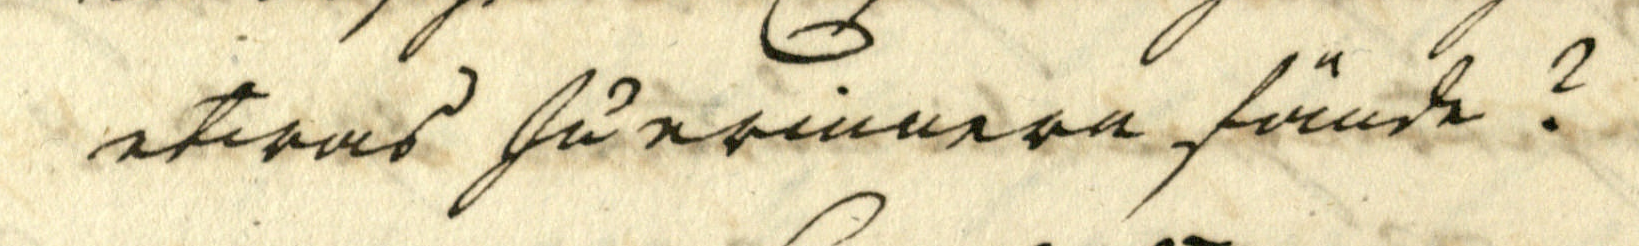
etwas zu erinnern fände?
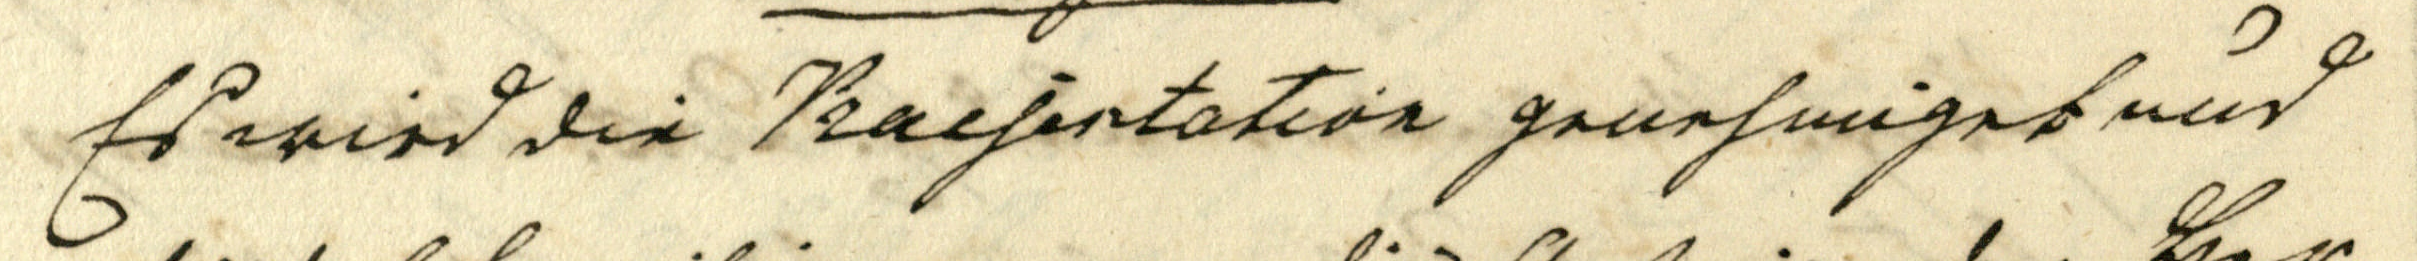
Es wird die Praesentation genehmiget und
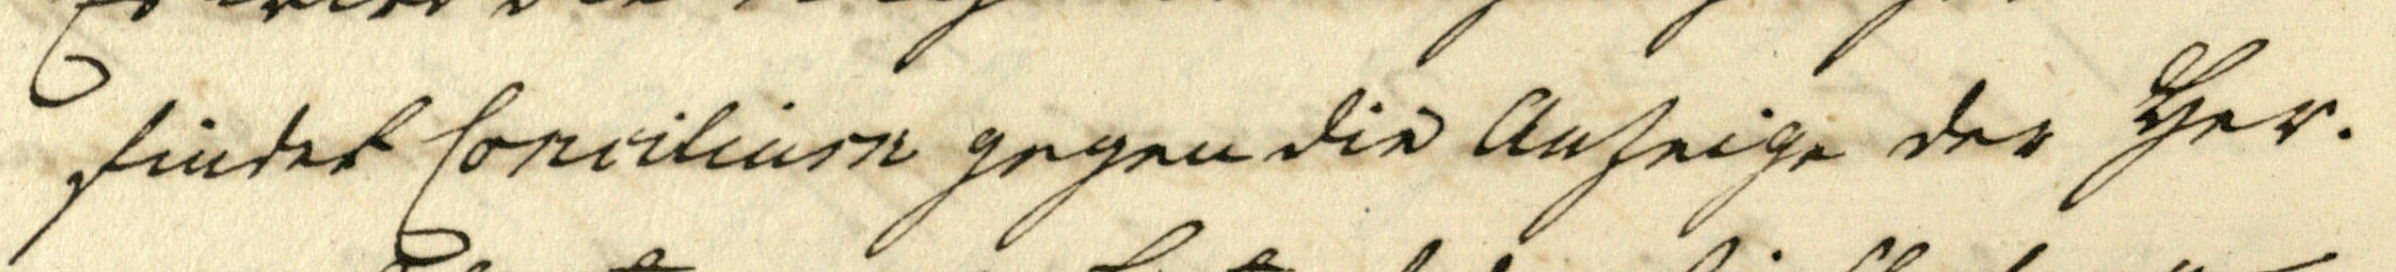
findet Concilium gegen die Anzeige der Her¬
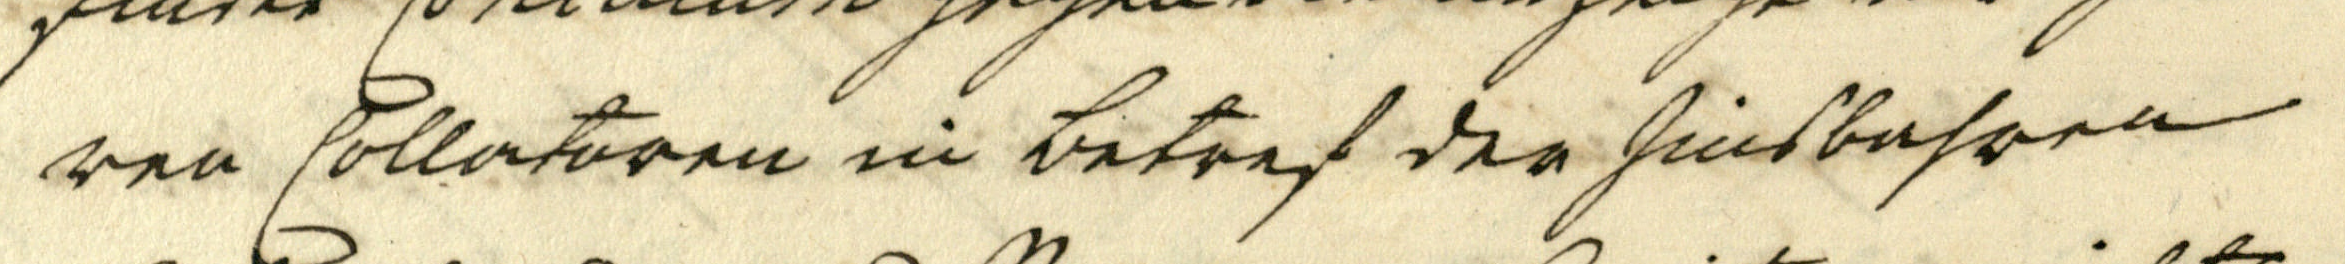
ren Collatoren in Betref der zinsbahren
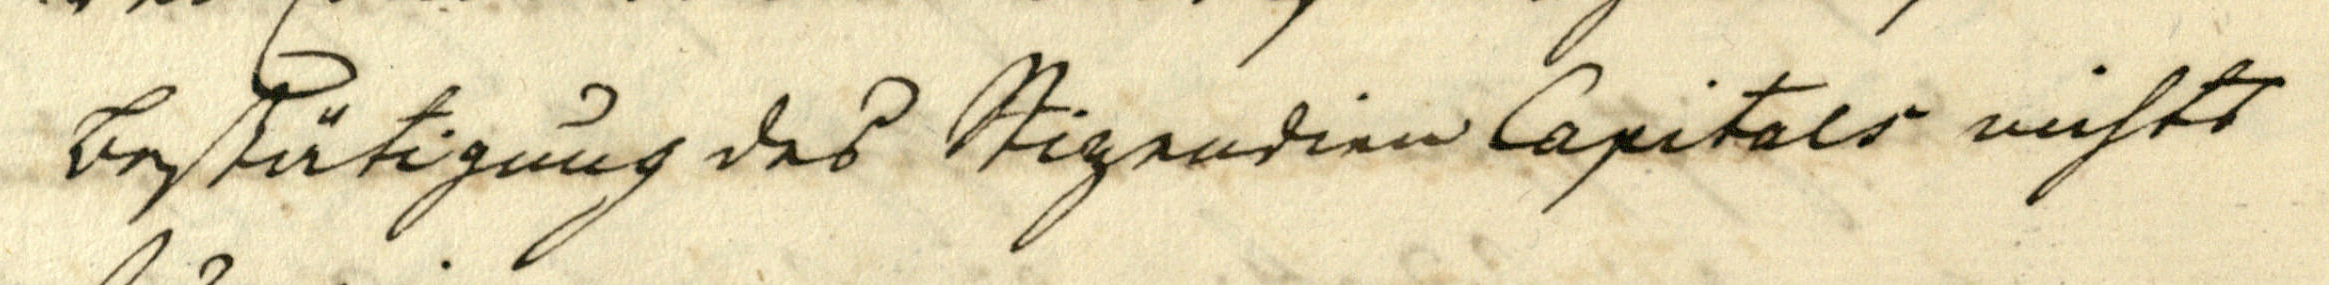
Bestätigung des Stipendien Capitals nichts
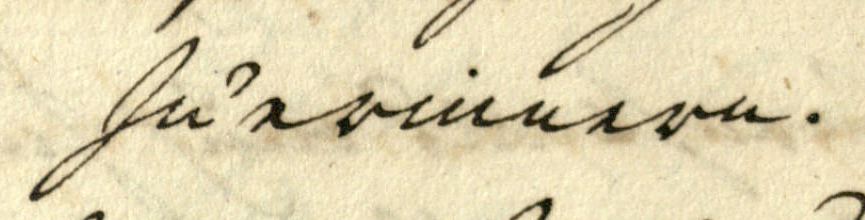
zu erinnern.
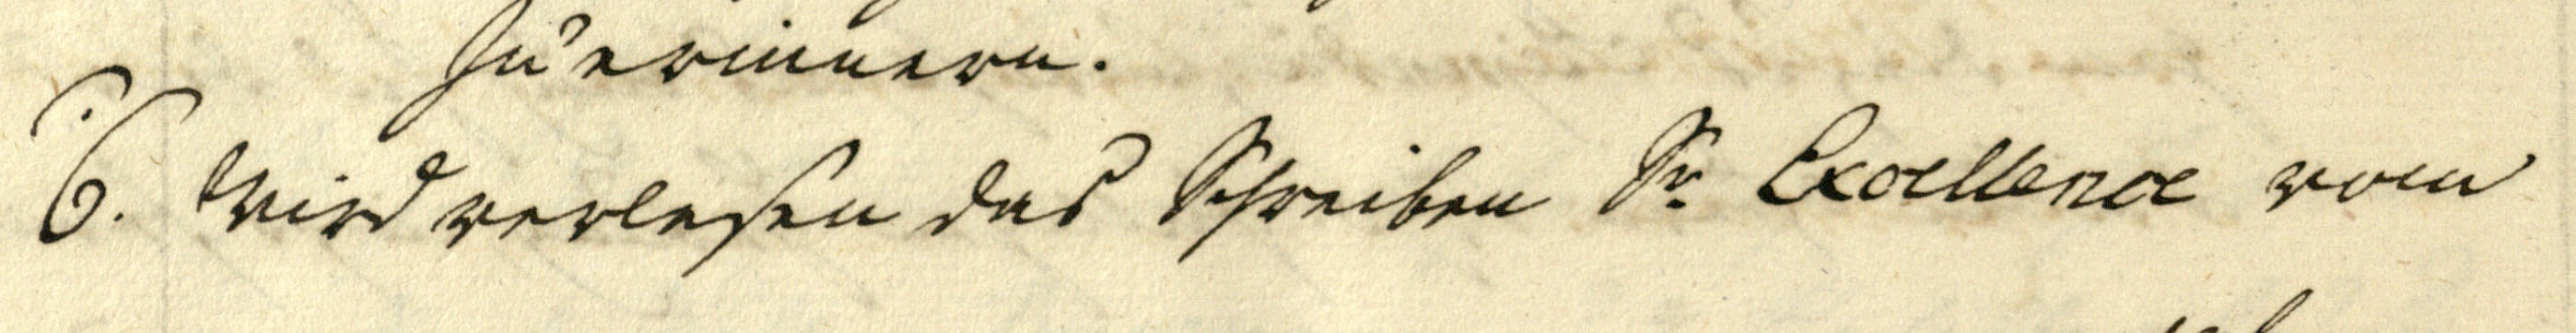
6. Wird verlesen das Schreiben Sr Excellence vom
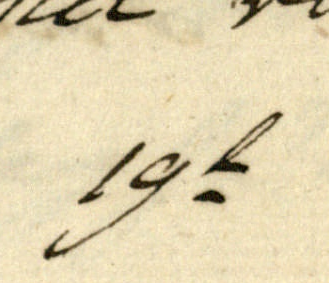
19 t
